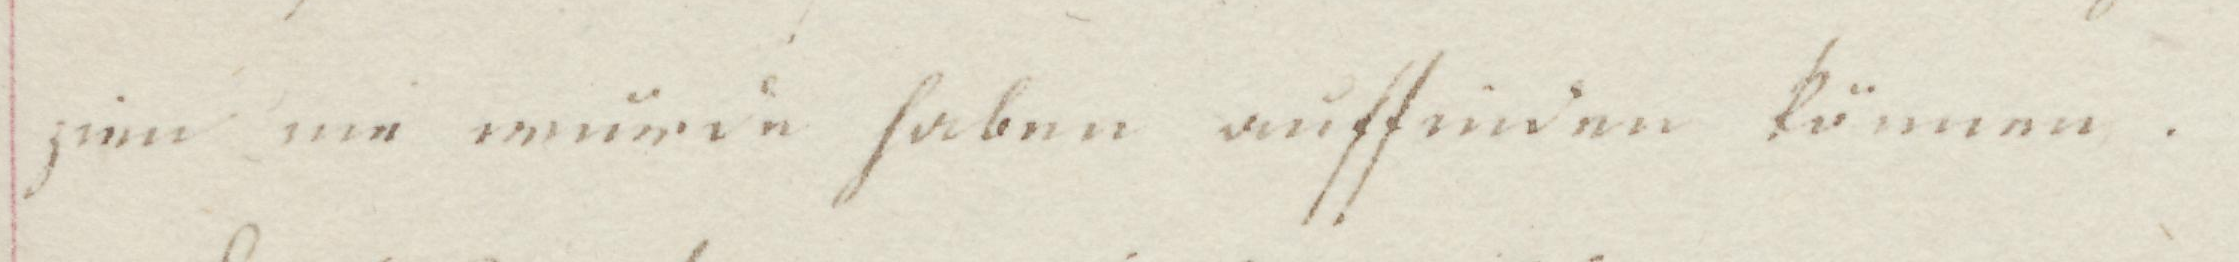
zien nie würde haben auffinden können.
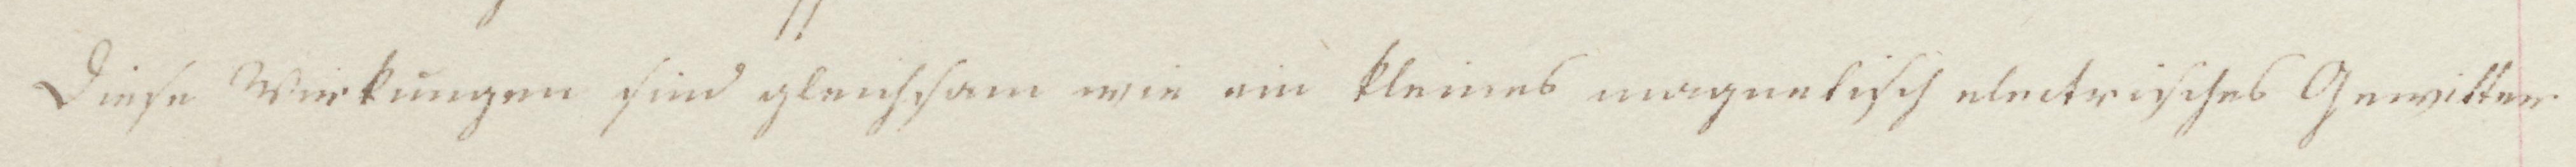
Diese Wirkungen sind gleichsam wie ein kleines magnetisch electrisches Gewitter
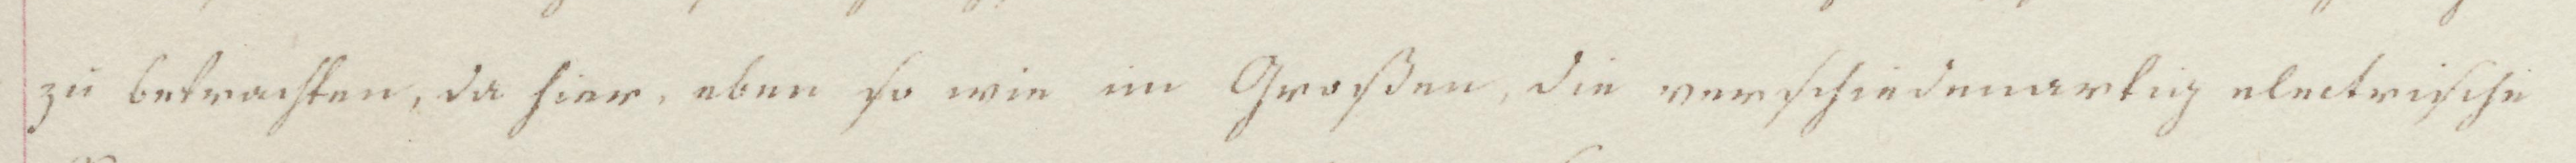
zu betrachten, da hier, eben so wie im Großen, die verschiedenartig electrische
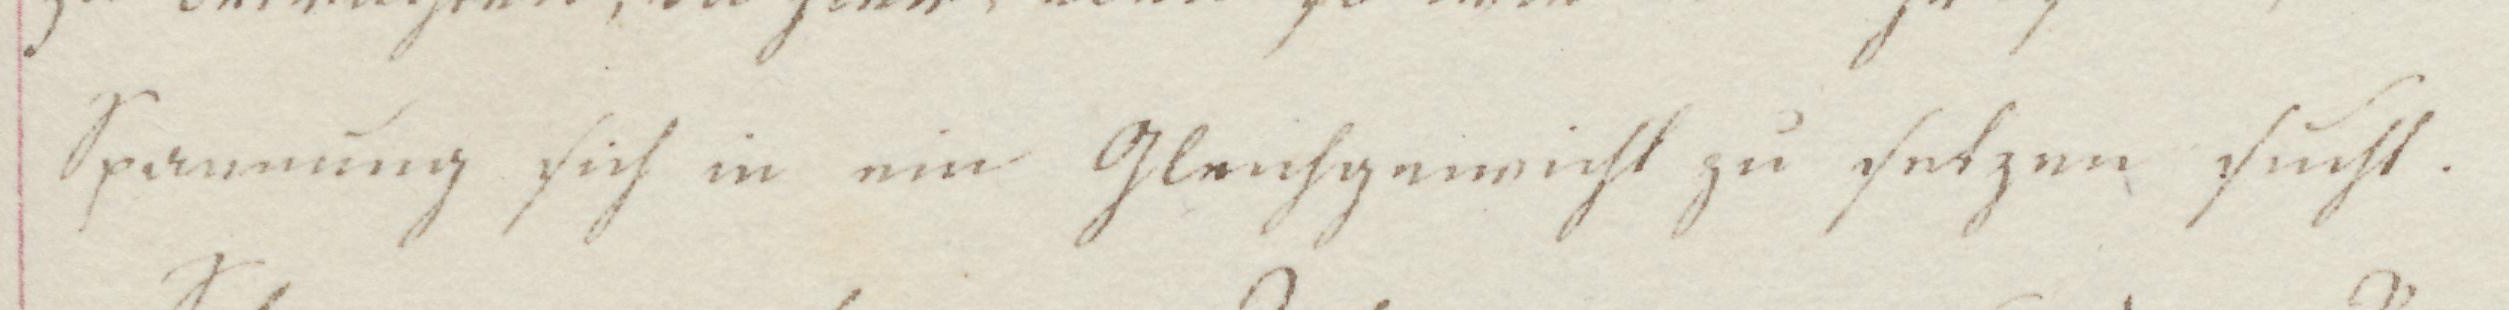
Spannung sich in ein Gleichgewicht zu setzen sucht.
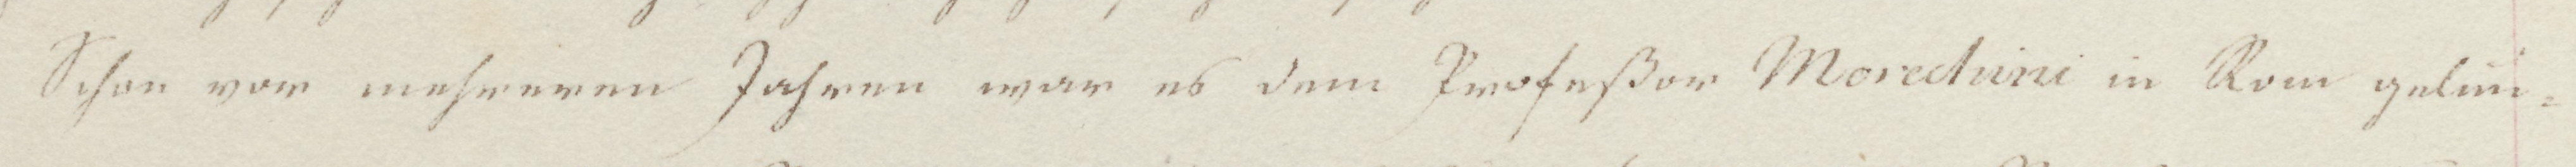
Schon vor mehreren Jahren war es dem Profeßor Morechini in Rom gelun-
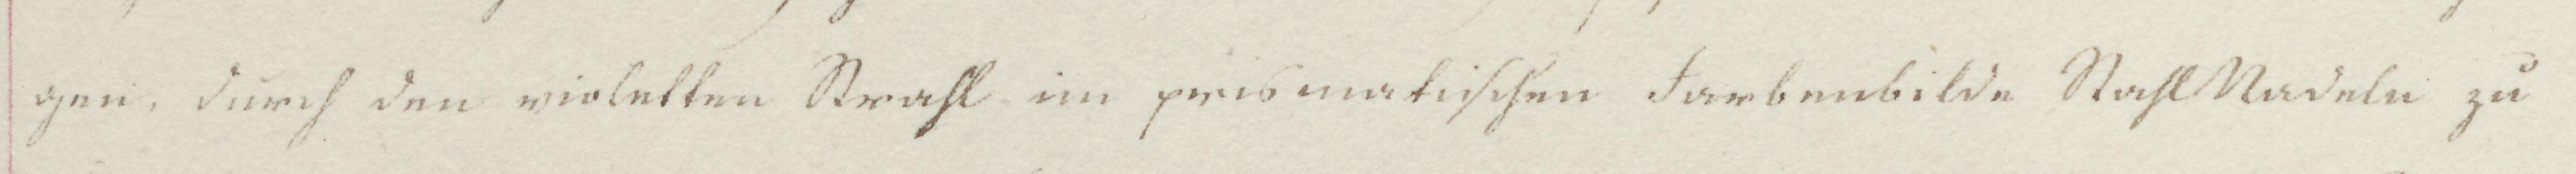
gen, durch den violetten Strahl im prismatischen Farbenbilde StahlNadeln zu
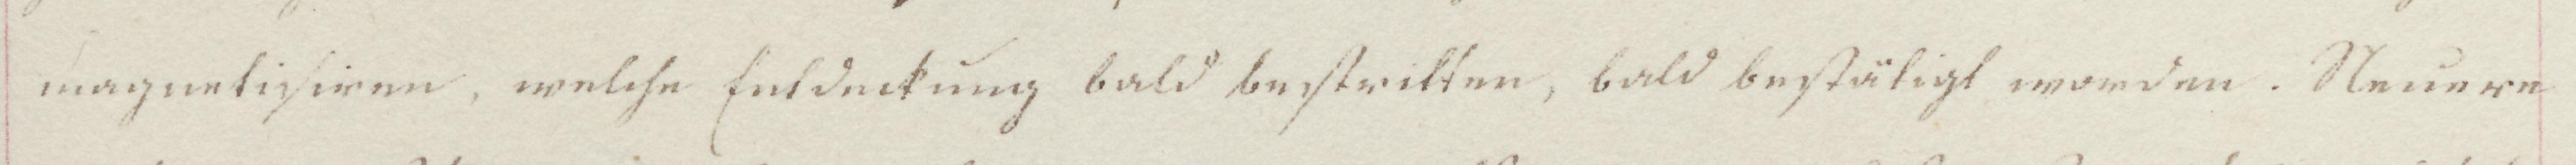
magnetisiren, welche Entdeckung bald bestritten, bald bestätigt worden. Neuere
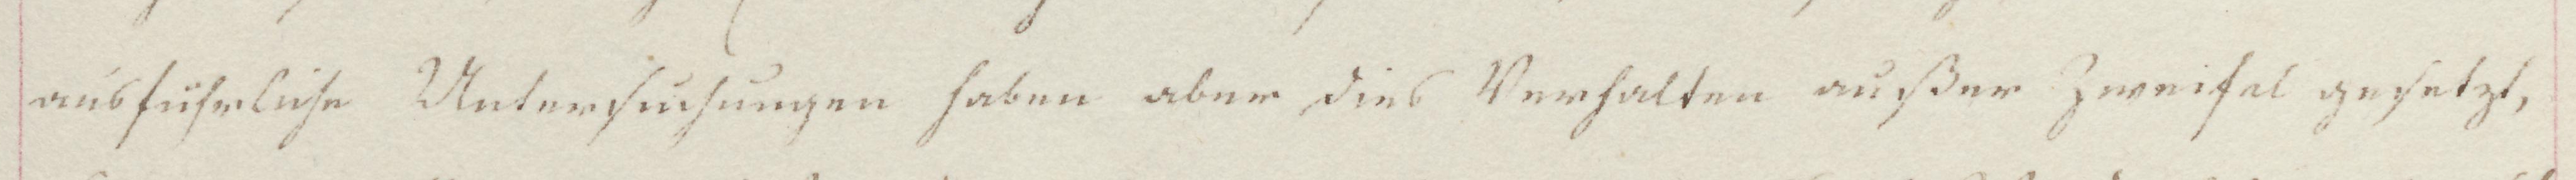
ausführliche Untersuchungen haben aber dies Verhalten außer Zweifel gesetzt,
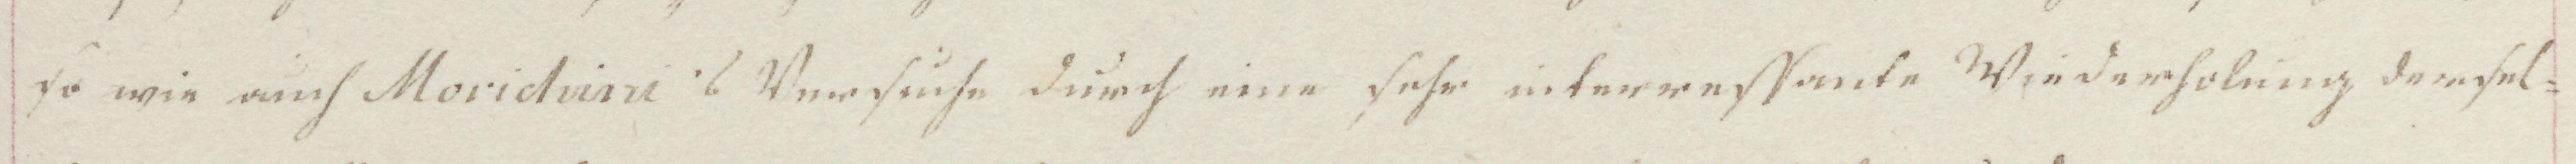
so wie auch Morichini's Versuche durch eine sehr interressante Wiederholung dersel-
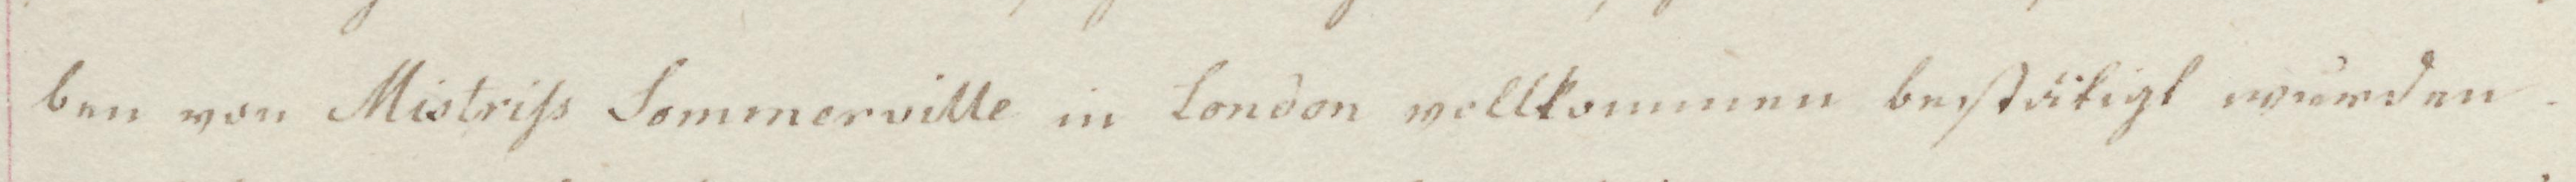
ben von Mistriss Sommerville in London vollkommen bestätigt wurden.
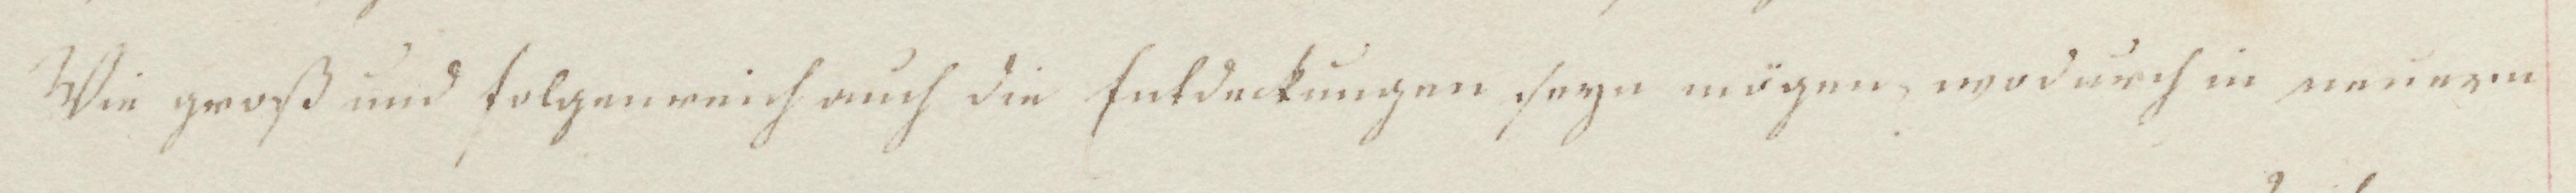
Wie groß und folgenreich auch die Entdeckungen seyn mögen, wodurch in neuern
